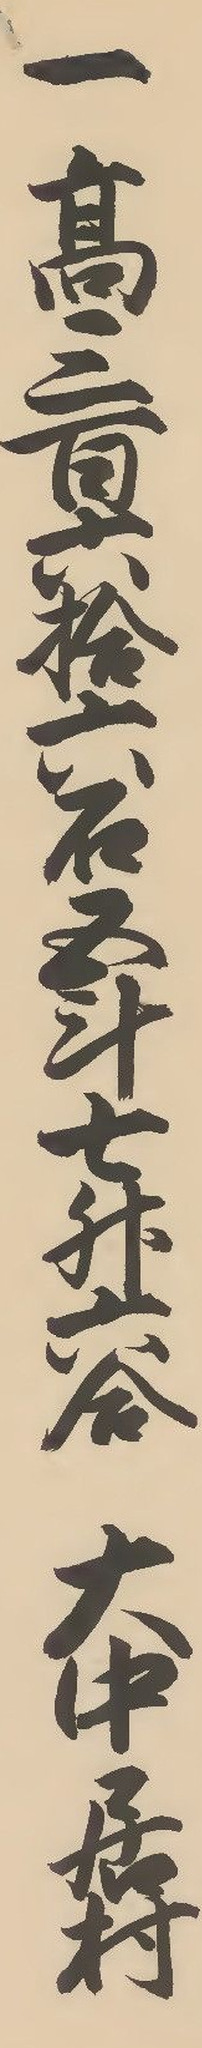一高三百六拾六石五斗七升六合大中居村
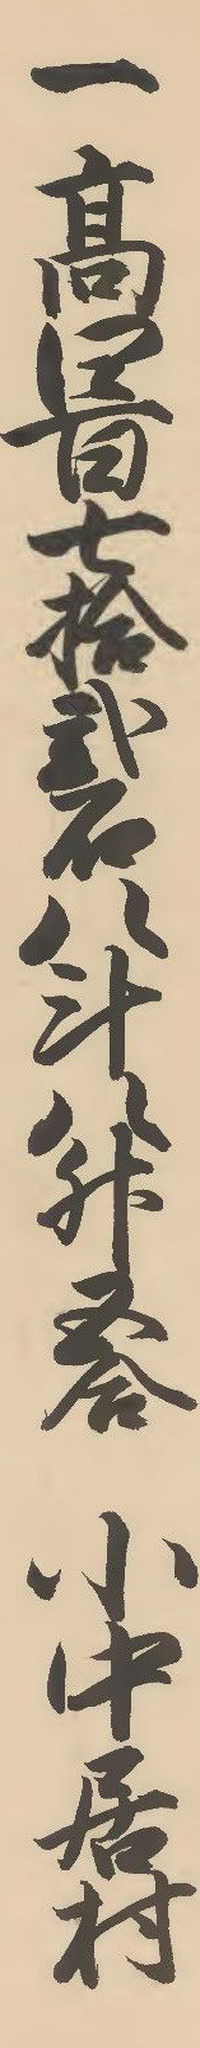一高四百七拾弐石八斗八升五合小中居村
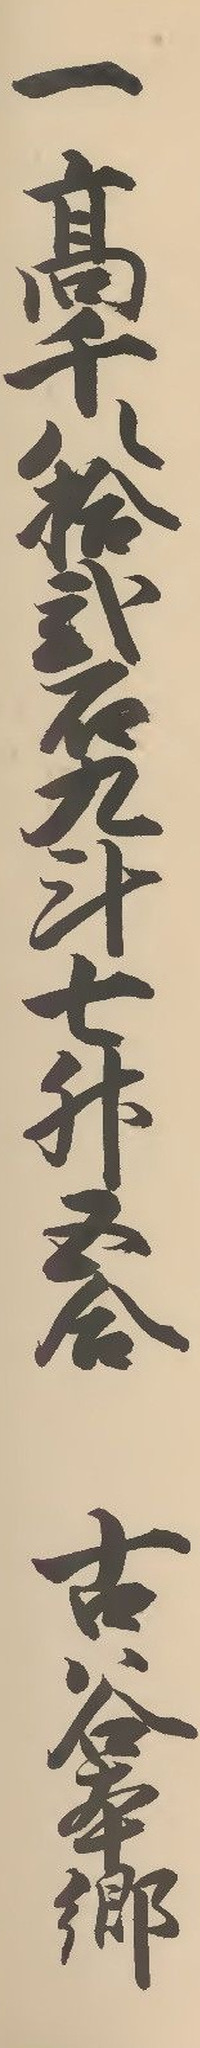一高千八拾弐石九斗七升五合古谷本郷
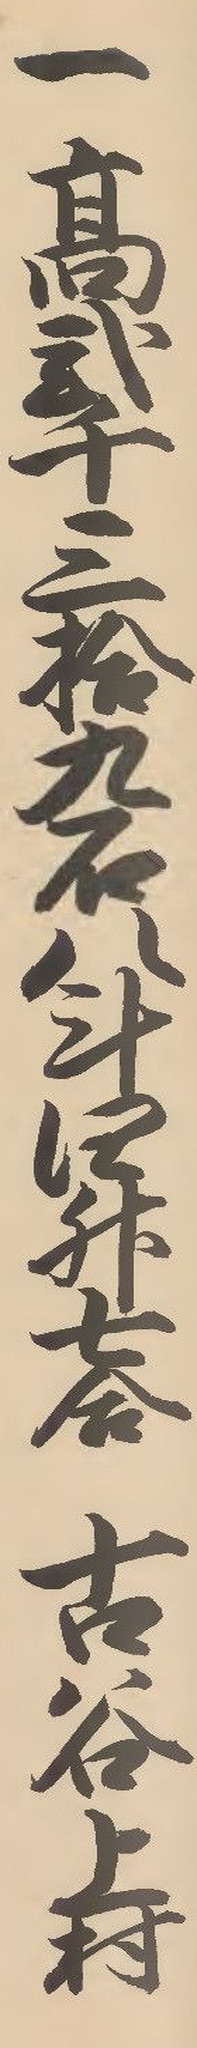一高弐千三拾九石八斗四升七合古谷上村
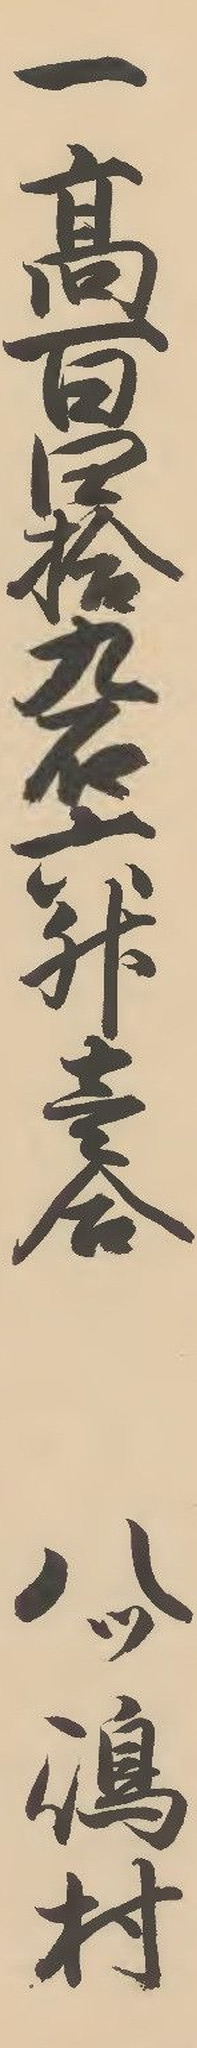一高百四拾九石六升壱合八ッ嶋村
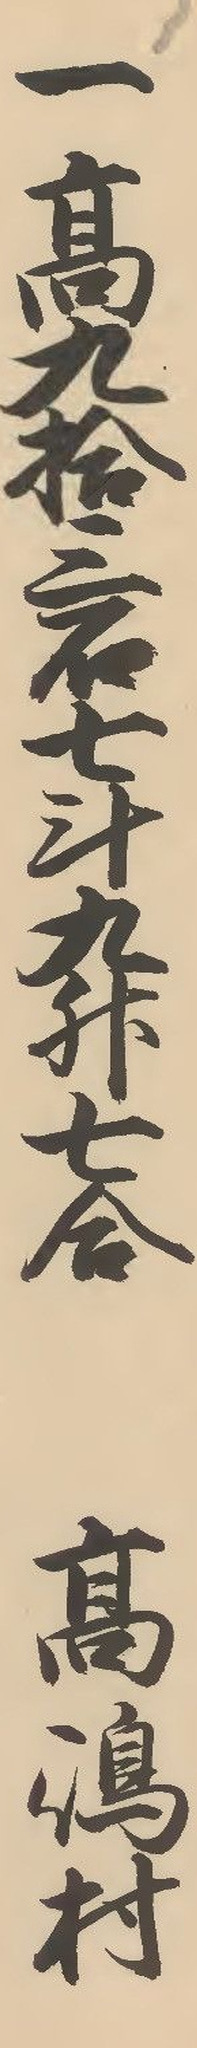一高九拾三石七斗九升七合高嶋村

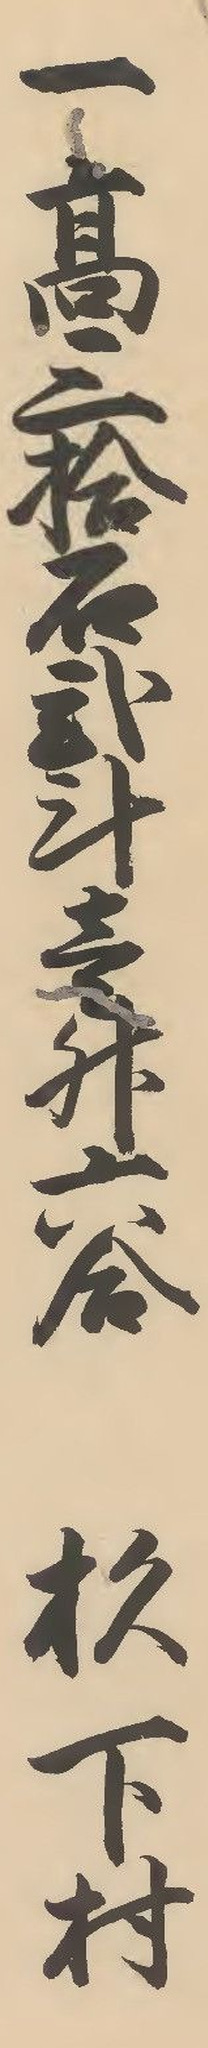一高三拾石弐斗壱升六合杉下村
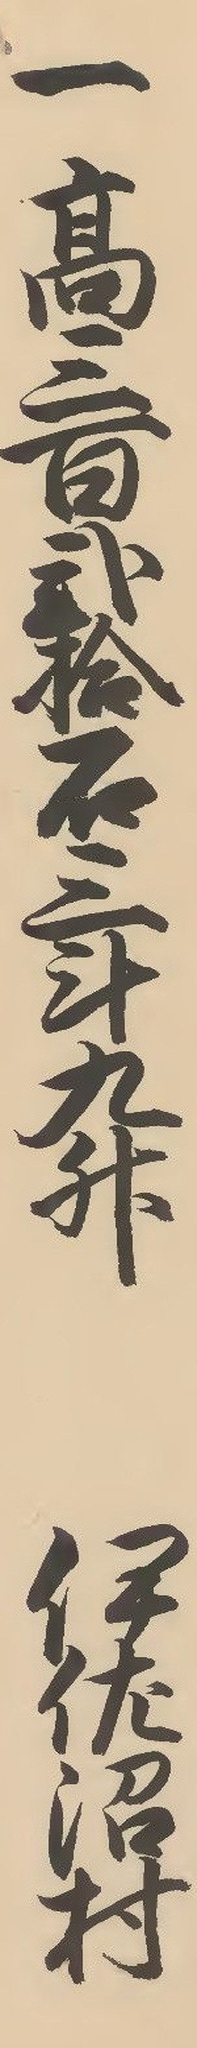一高三百弐拾石三斗九升伊佐沼村
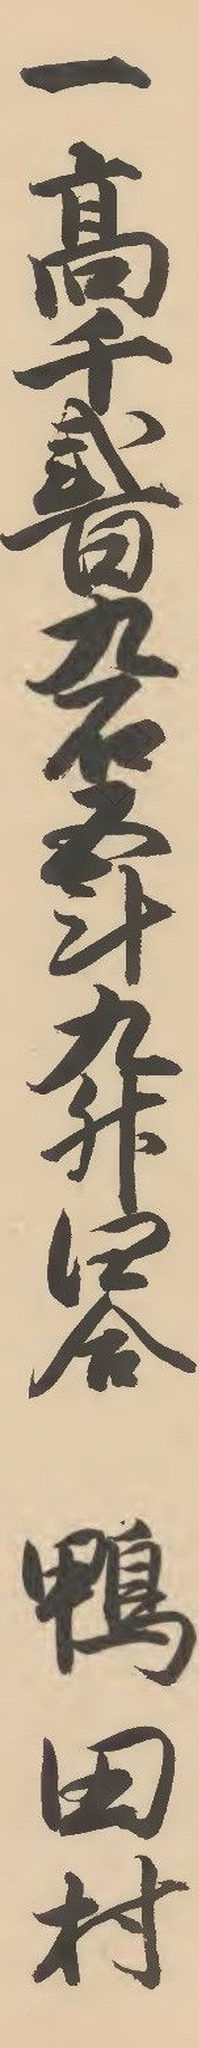一高千弐百九石五斗九升四合鴨田村
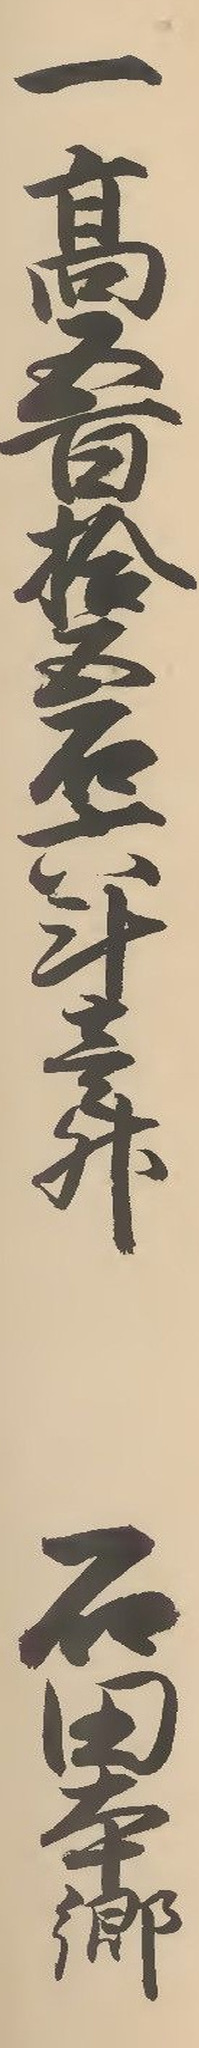一高五百拾五石六斗壱升石田本郷
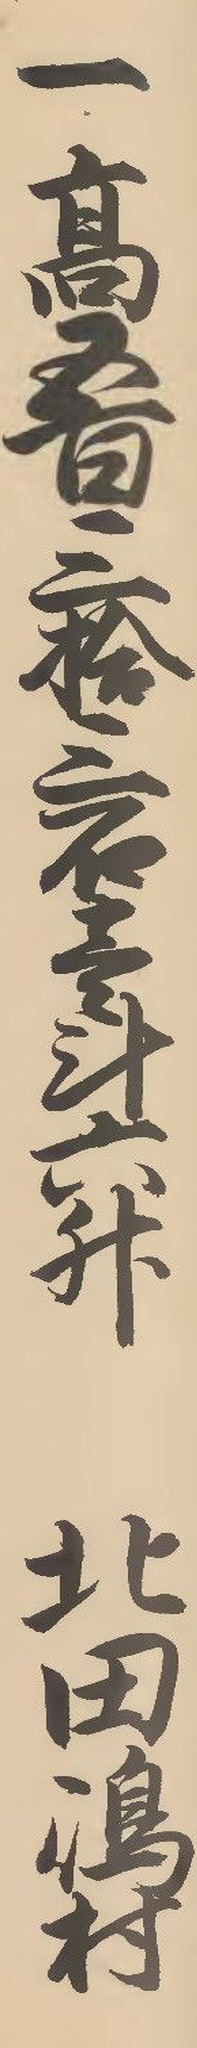一高五百三拾三石壱斗六升北田嶋村
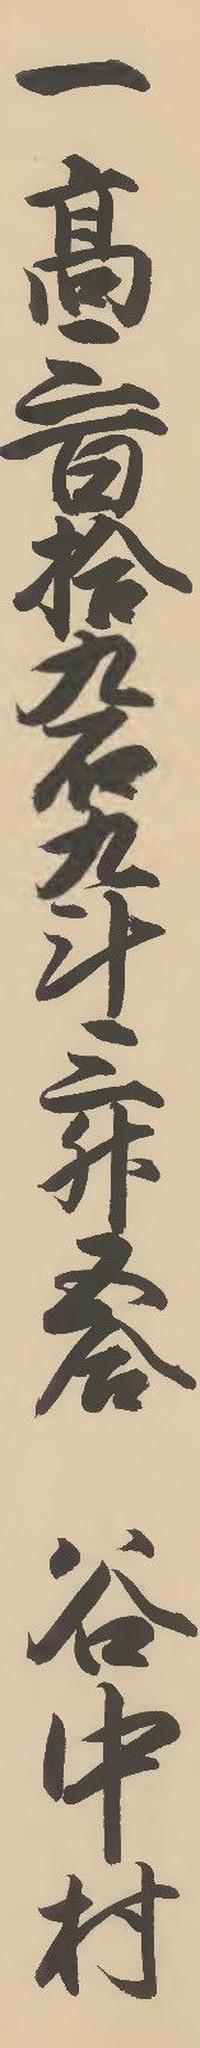一高三百拾九石九斗三升五合谷中村
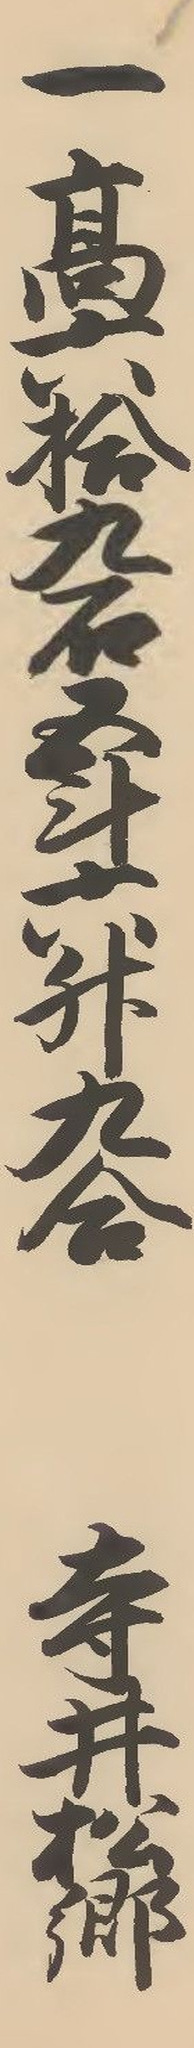一高六拾九石五斗六升九合寺井松郷
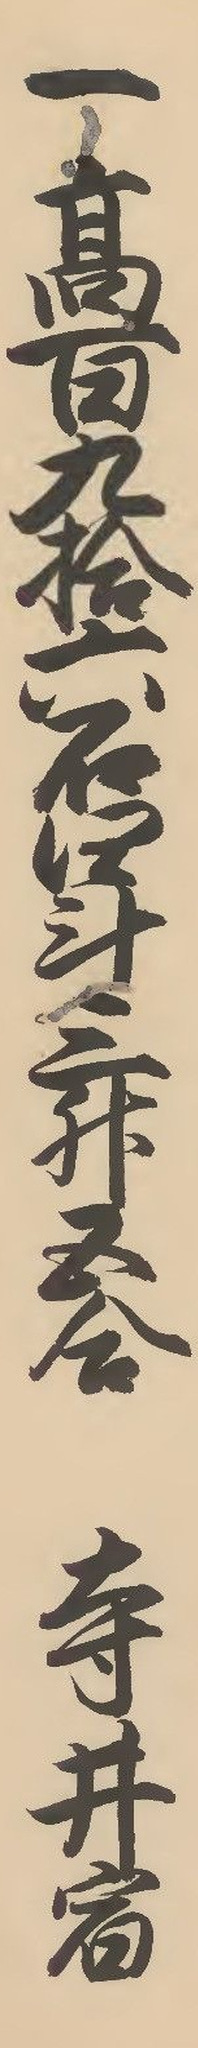一高百九拾六石四斗三升五合寺井宿

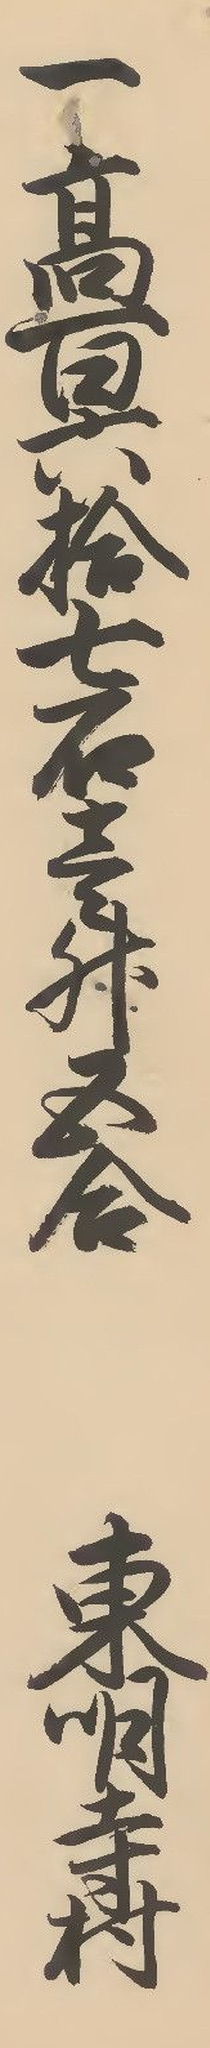一高百六拾七石壱升五合東明寺村
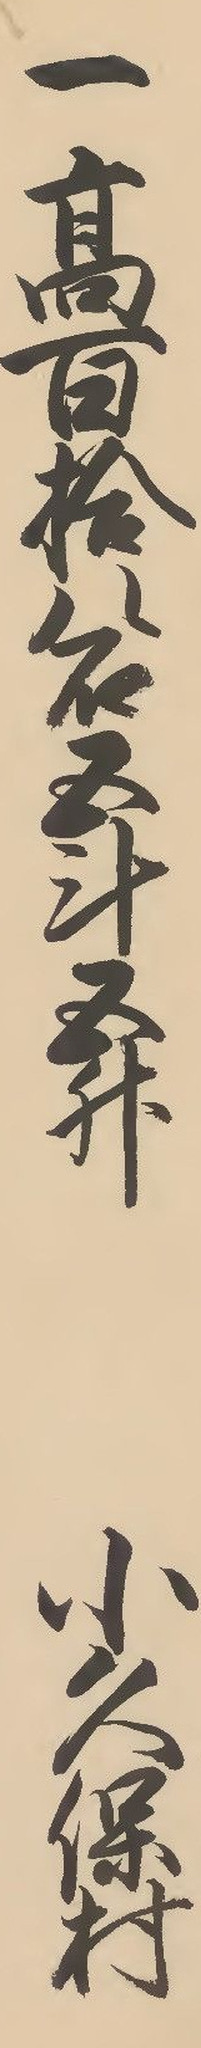一高百拾八石五斗五升小久保村
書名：武蔵国郷帳　上
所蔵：国立公文書館 National Archives of Japan
